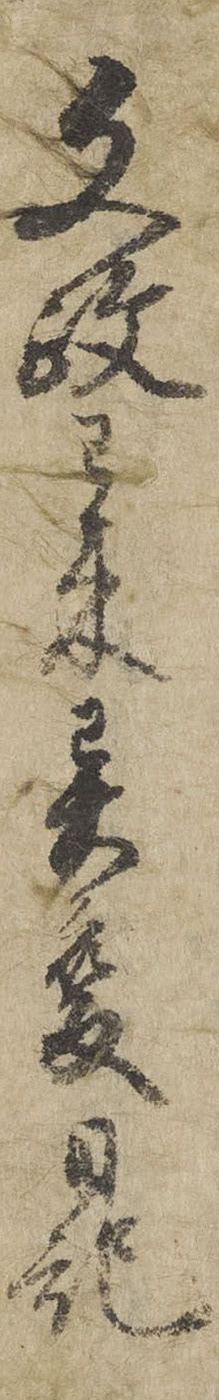文政已来異変日記

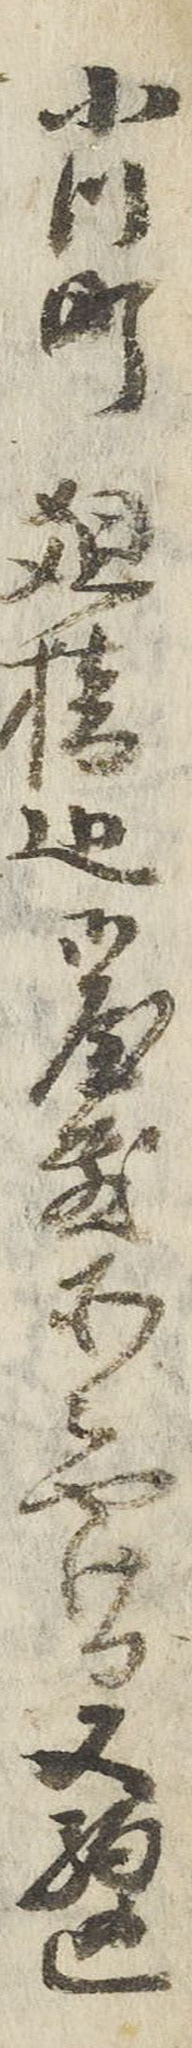小川町俎板橋辺御屋敷所々やける又駒込
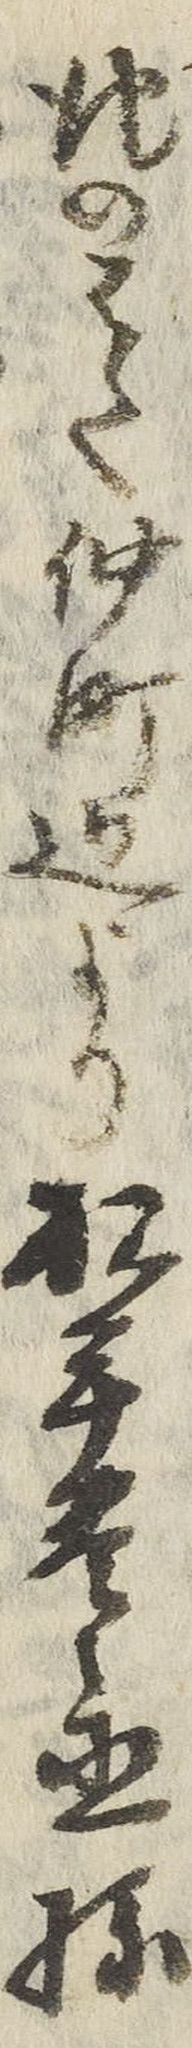池のはた仲町辺より松平豊之丞様
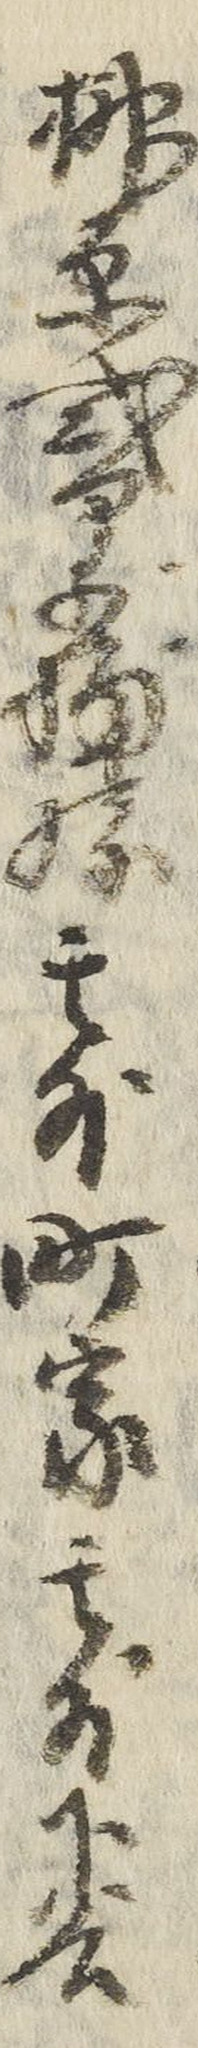榊原式部少輔様其外町家其外下谷
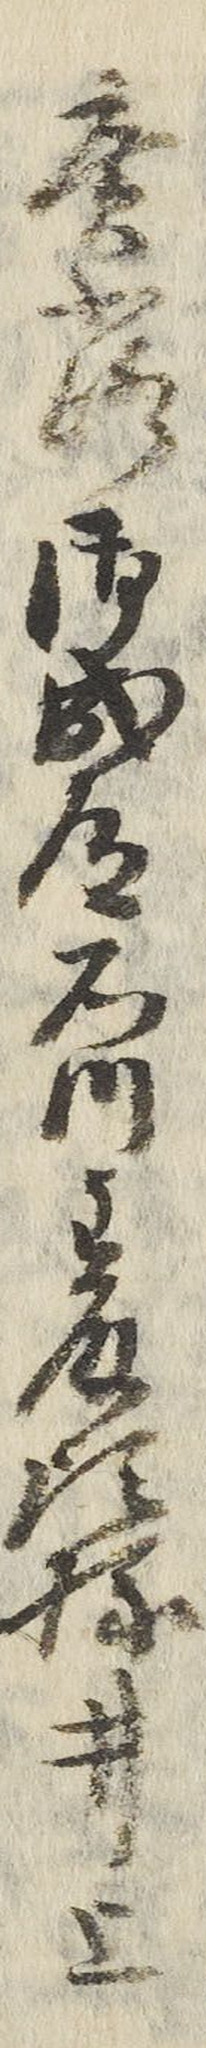廣小路御成道石川主殿頭様井上
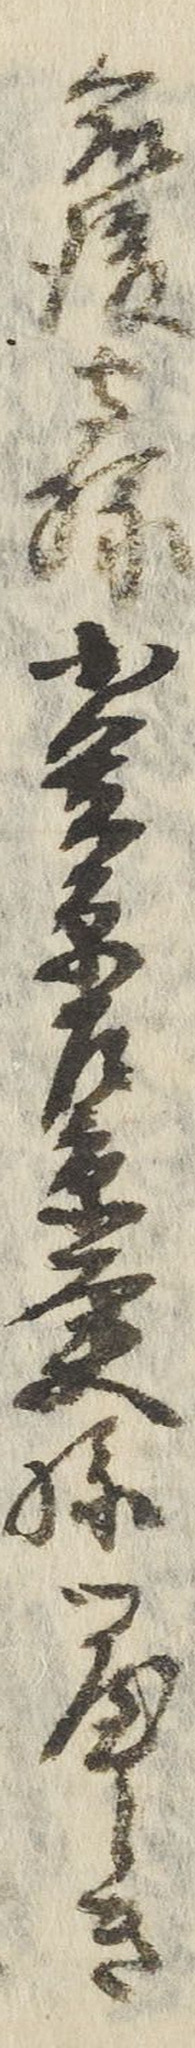筑後守様小笠原左京大夫様御屋しき
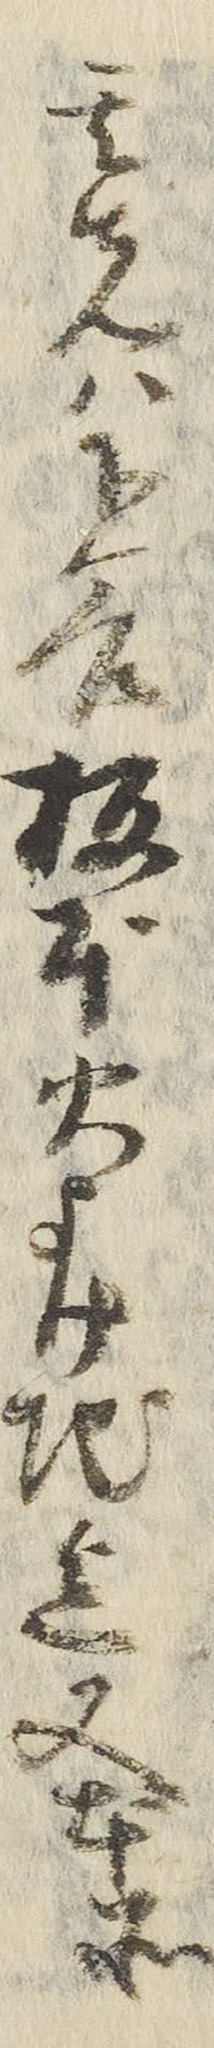其先ハ下谷坂本火よけ地迄又本所
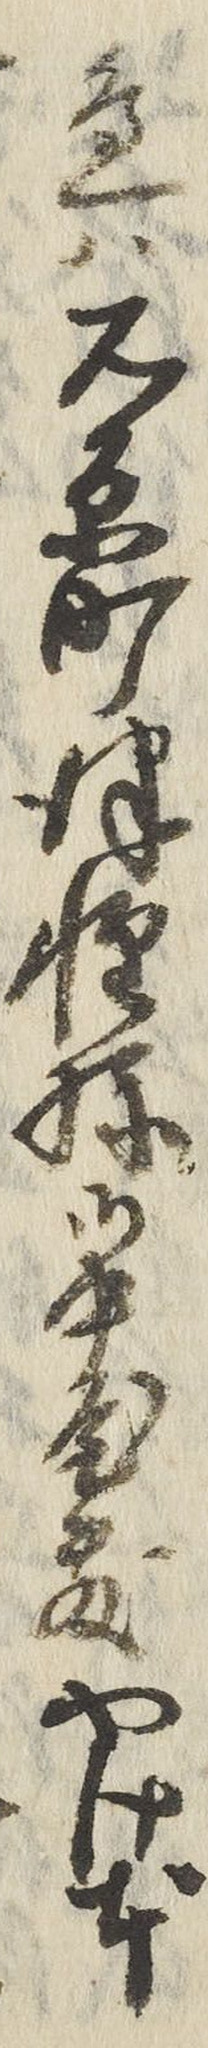辺ハ石原町津軽様御中屋敷やけ本
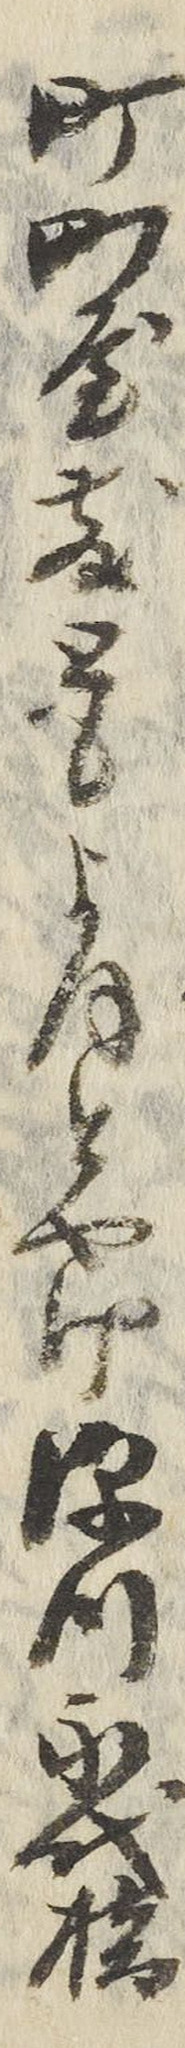町町屋敷ともよほとやけ深川永代橋
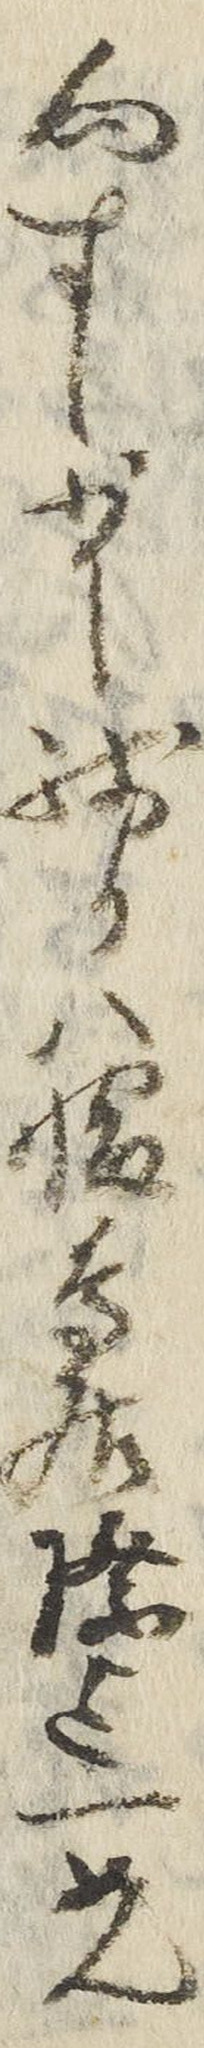向すし少し残り八幡鳥居際迄一めん
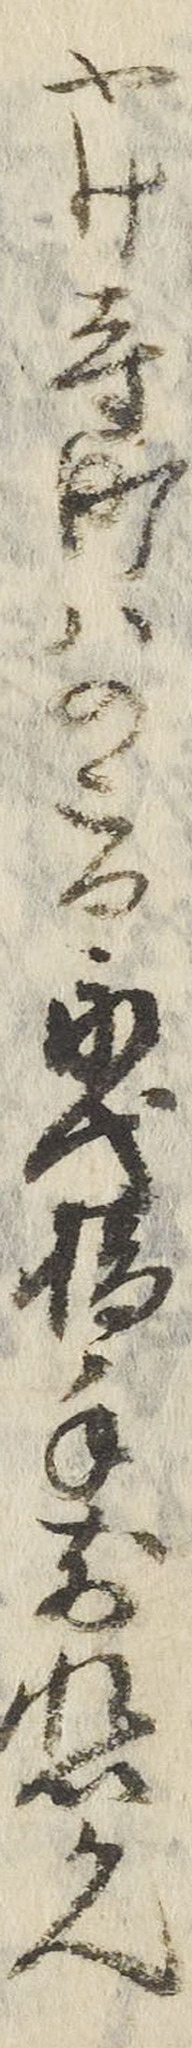やけ寺町ハのこる永代橋手前れいかん
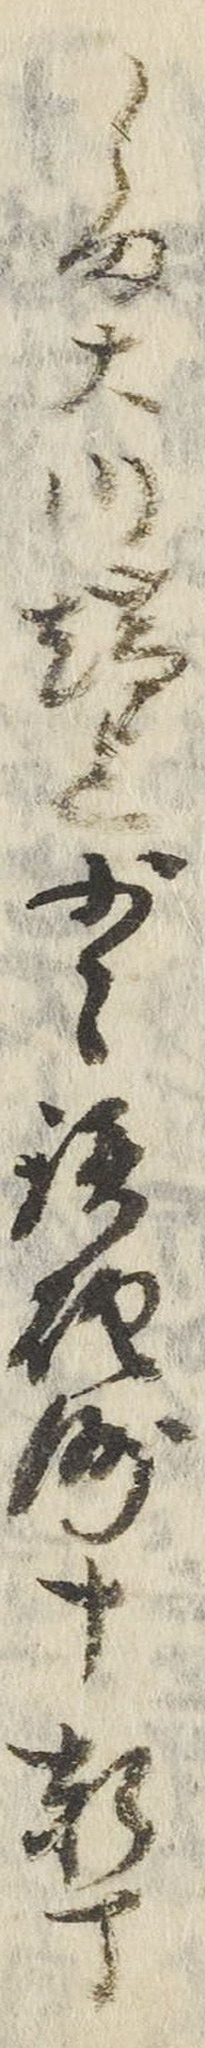しま大川端迄少々鉄砲洲十軒丁
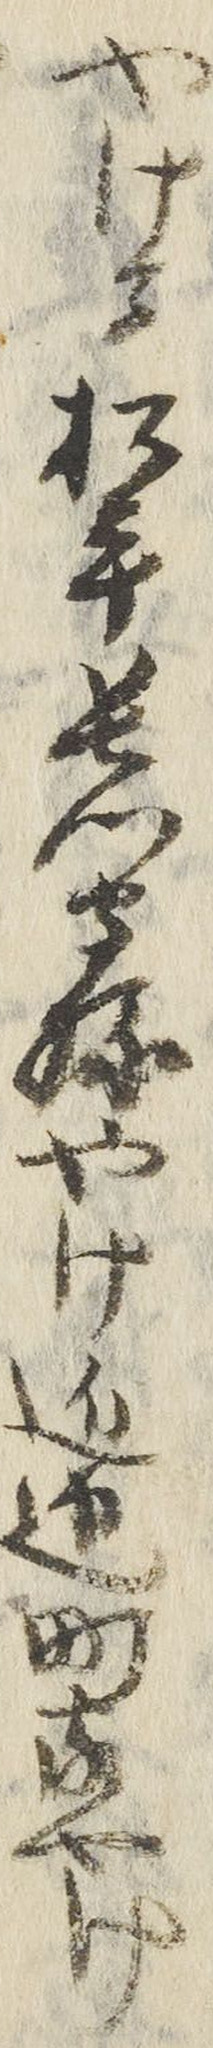やける松平長門守様やけ近辺町家やけ
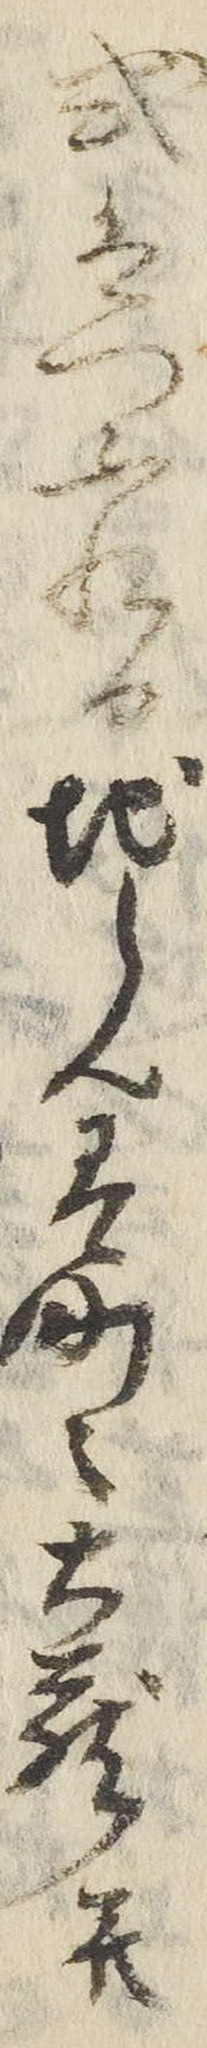或はつふれる地しんにて町々土蔵并
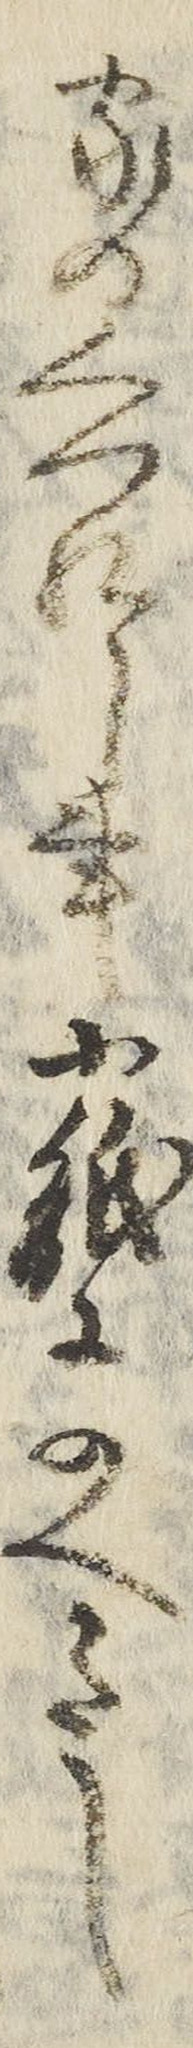家のくつれし事小紙にのへかたし
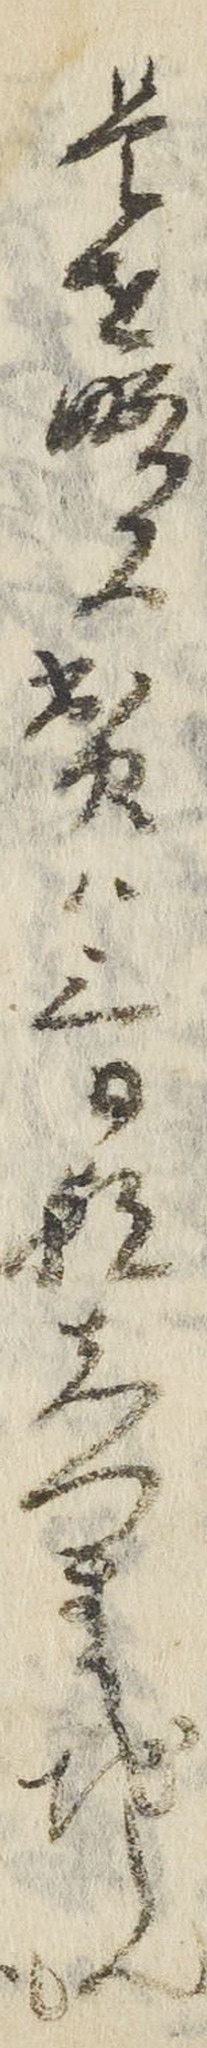是を略ス出火ハ三日朝しつまり地しんも
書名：文政已来異変日記
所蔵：要相談
